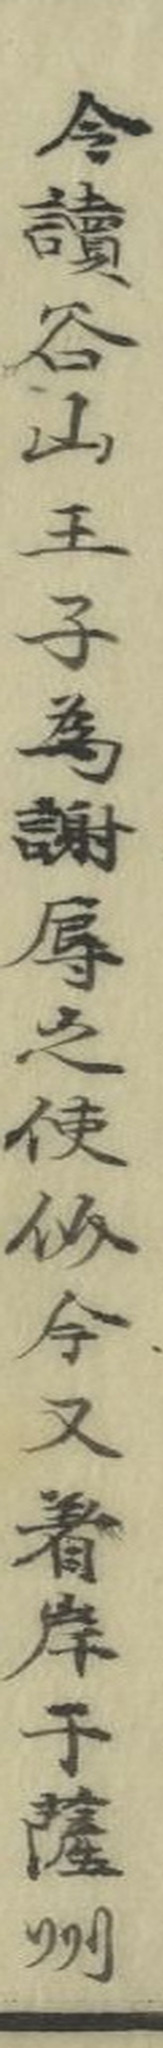今読谷山王子為謝辱之使价今又着岸于薩州
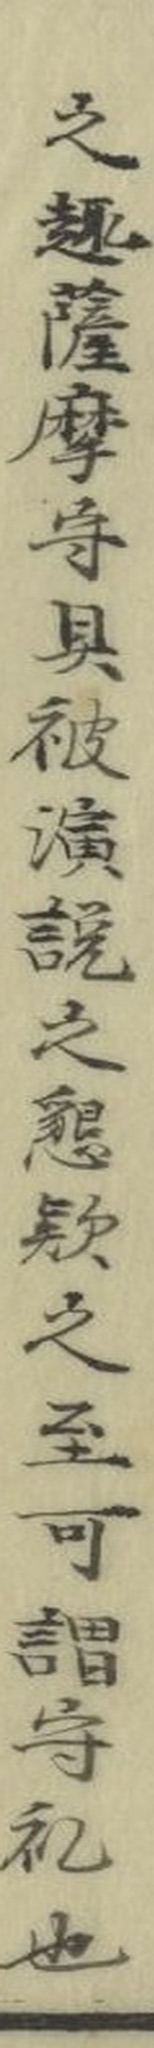之趣薩摩守具被演説之懇款之至可謂守礼也
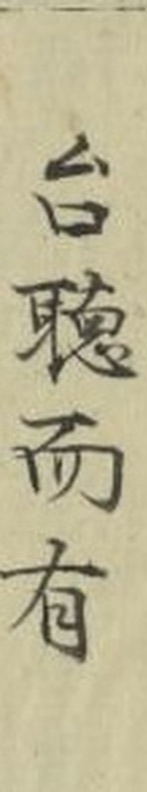台聴而有
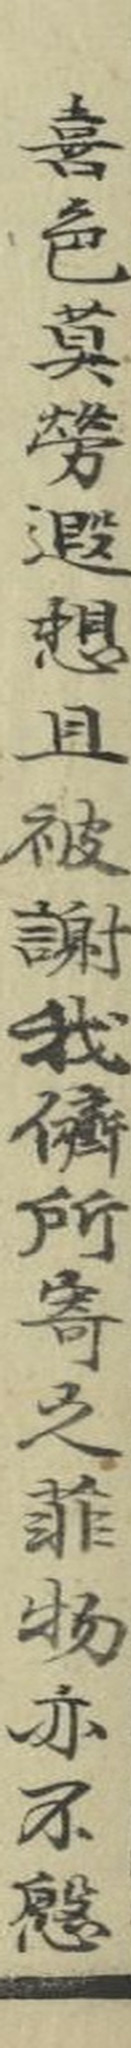喜色莫労遐想且被謝我済所寄之菲物亦不慇
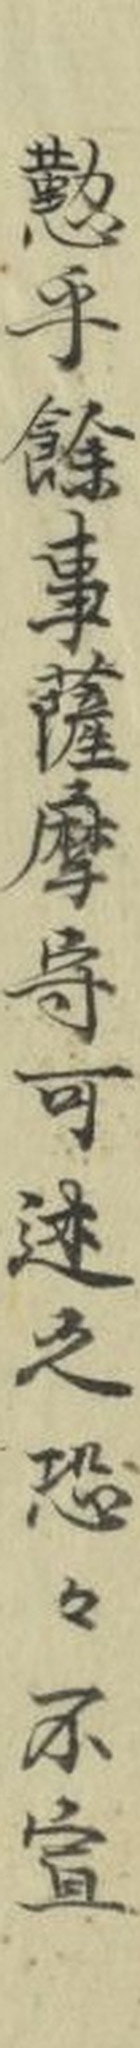勤乎余事薩摩守述之恐々不宣
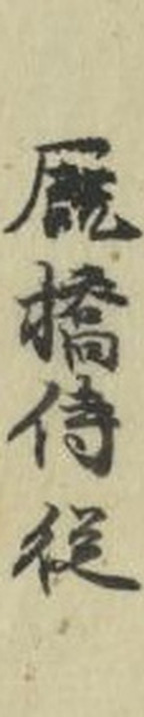厩橋侍従
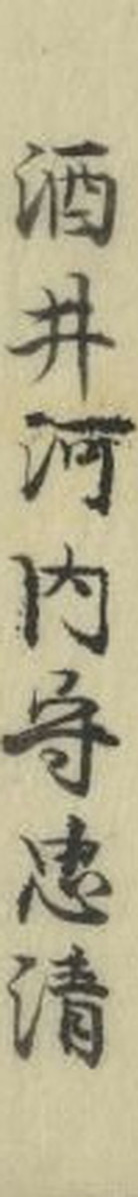酒井河内守忠清
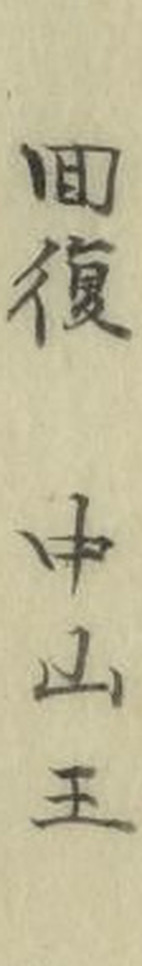回復中山王
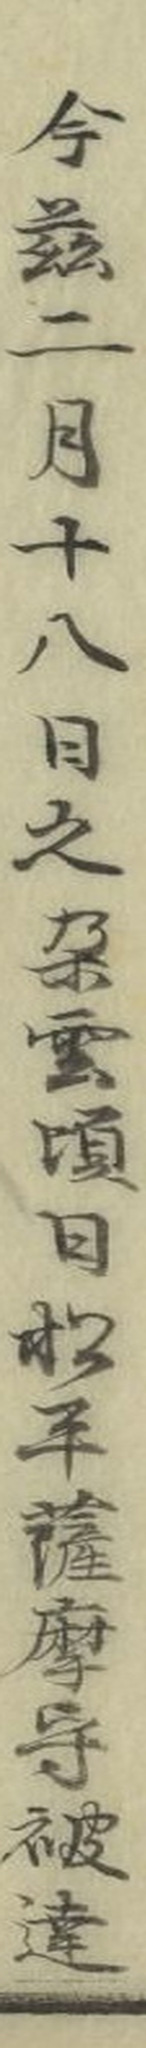今茲二月十八日之朶雲頃日松平薩摩守被達
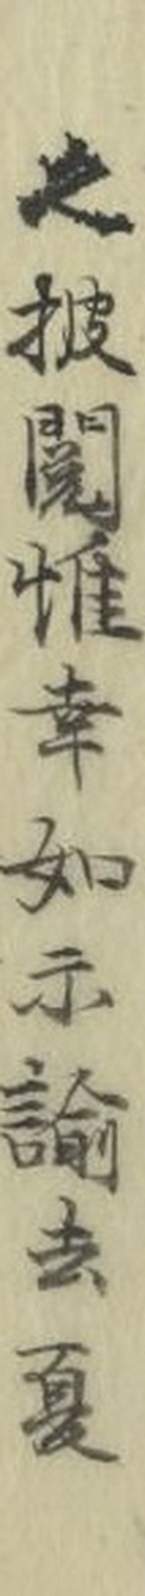之被閲惟幸如示諭去夏
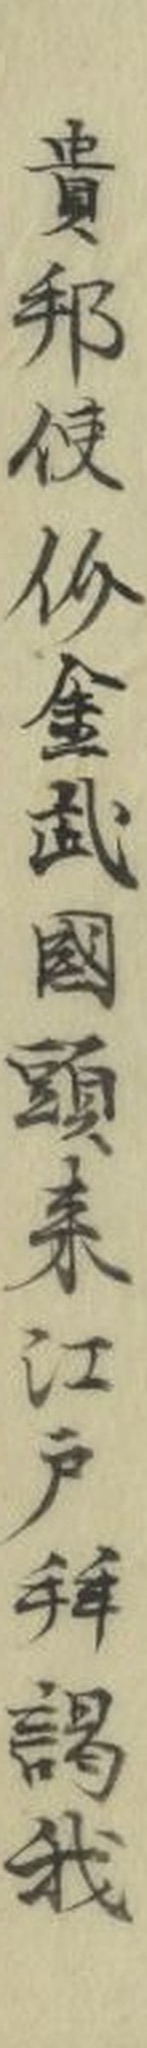貴邦使价金武国頭来江戸拝謁我

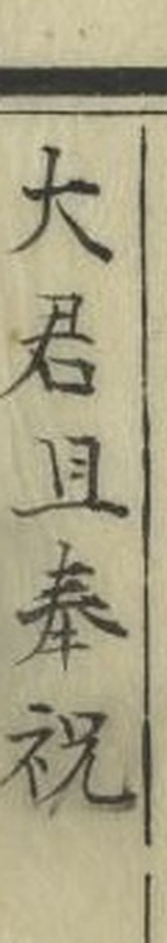大君且奉祝
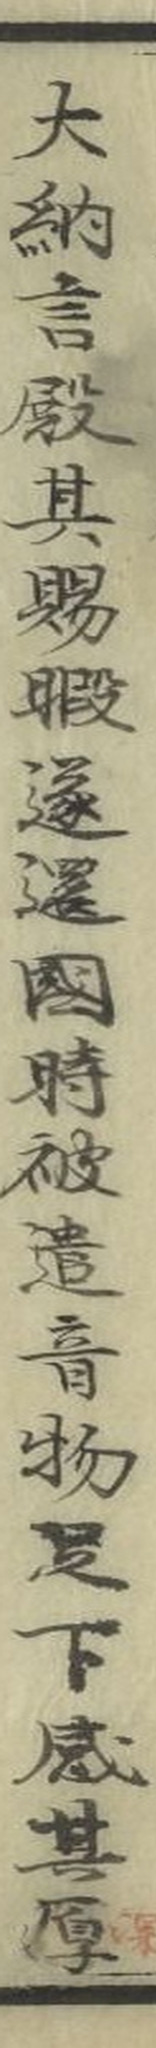大納言殿其賜暇遂還国時被遣音物足下感其厚
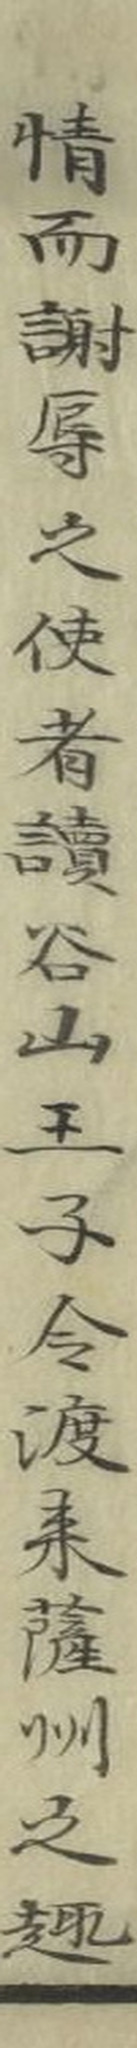情而謝辱之使者読谷山王子令渡来薩州之趣
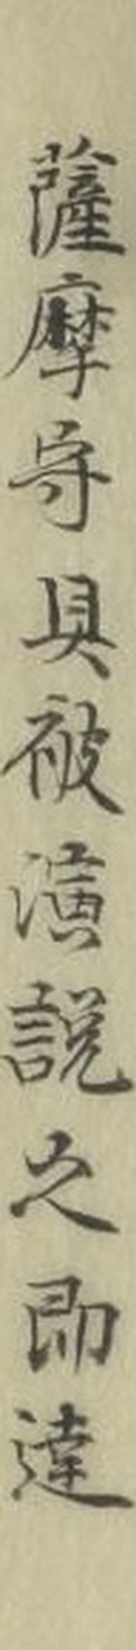薩摩守具被演説之而達
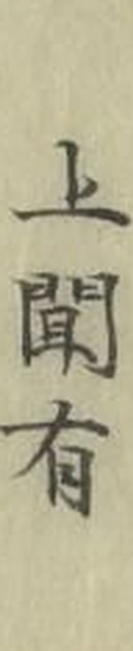上聞有
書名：琉球往来（上）
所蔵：University of the Ryukyus Library
